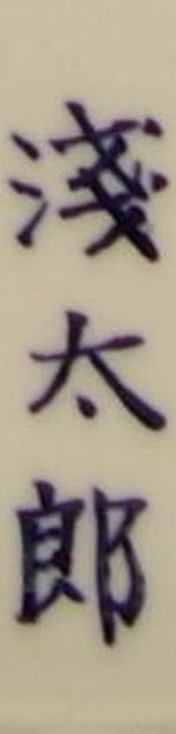浅太郎
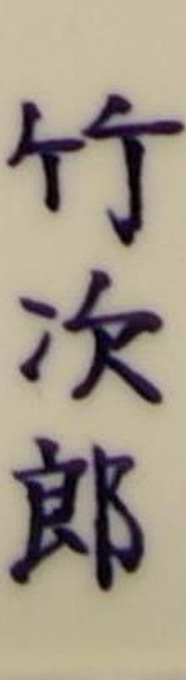竹次郎
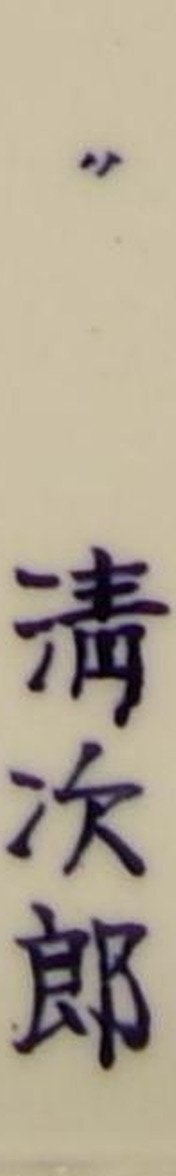清次郎
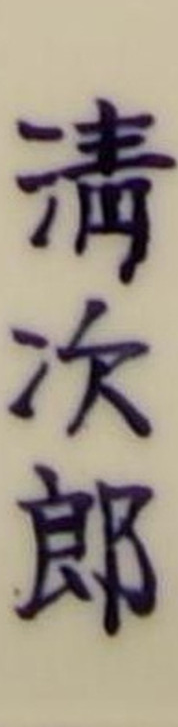清次郎
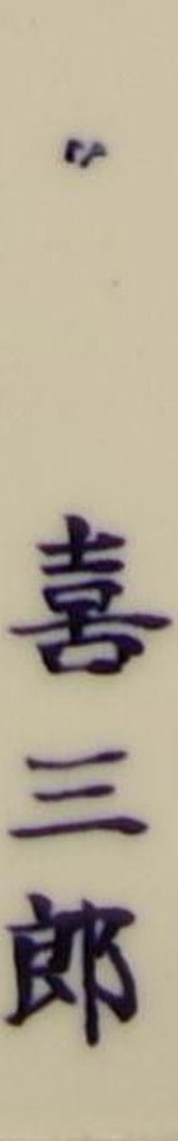喜三郎
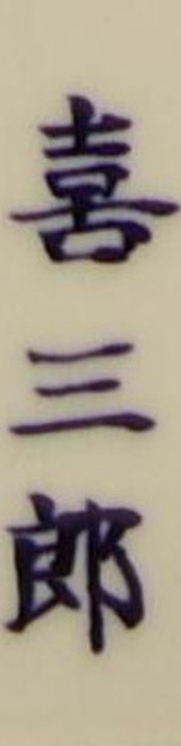喜三郎
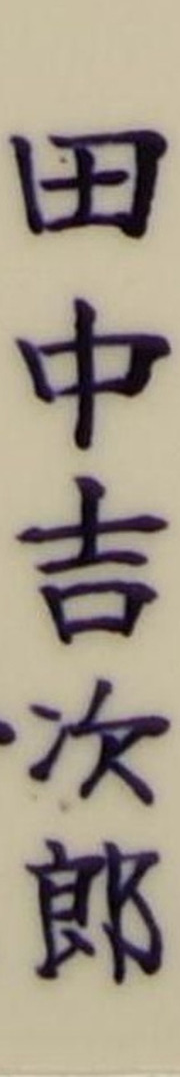田中吉次郎
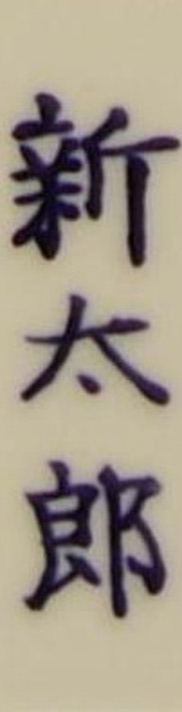新太郎
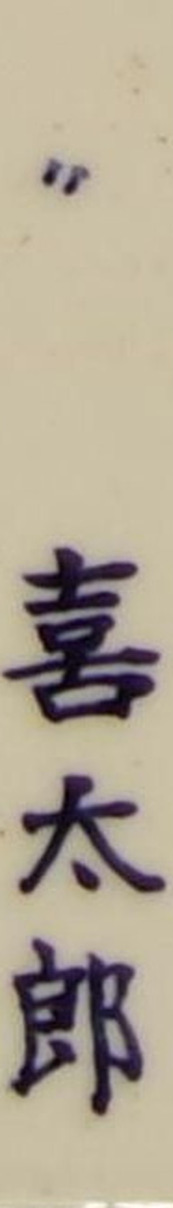喜太郎
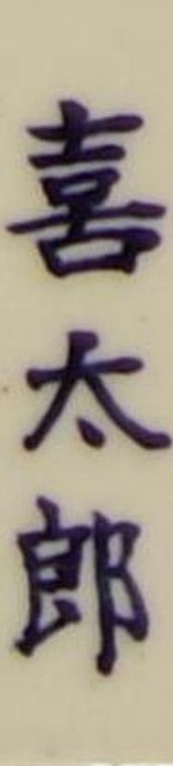喜太郎
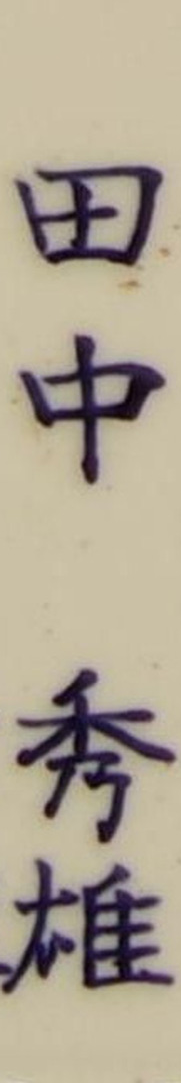田中秀雄

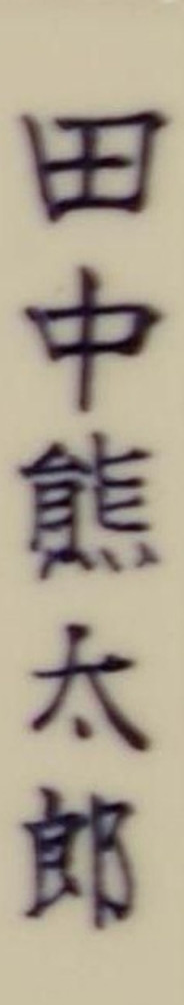田中熊太郎
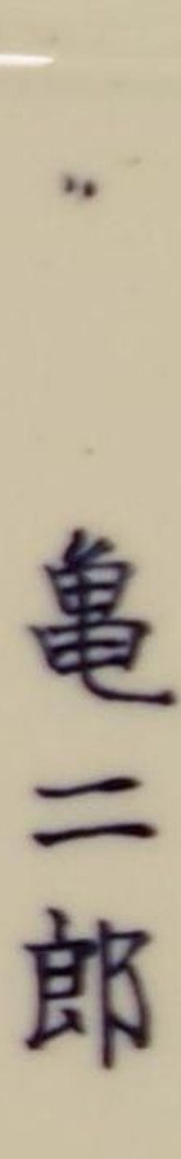亀二郎
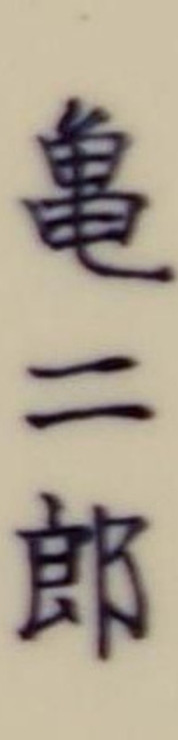亀二郎
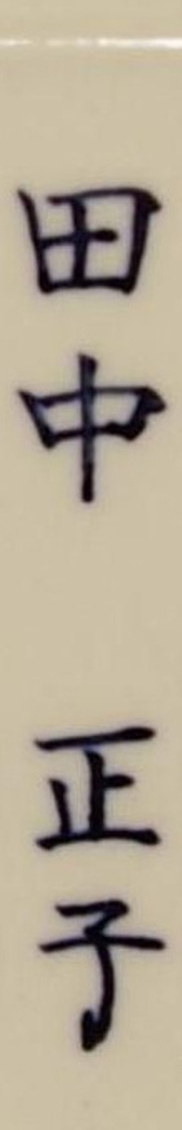田中正子
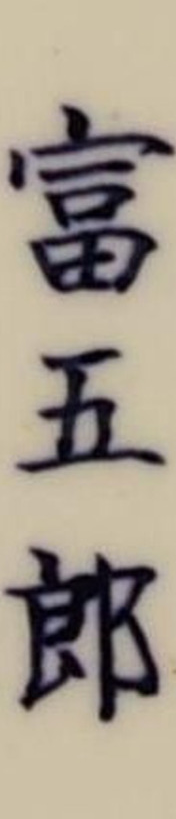富五郎
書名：A~D
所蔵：koyasan kongobuji
